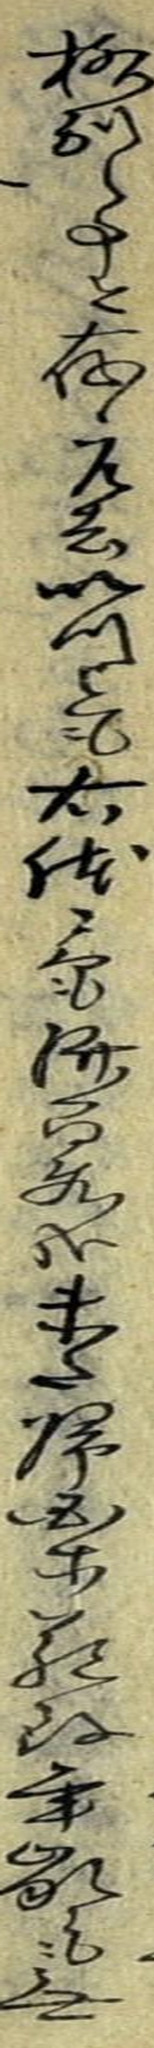格別之事と存候乍去いつ迄も右体ニ而も済間敷哉未た帰国等難致年齢ニも無
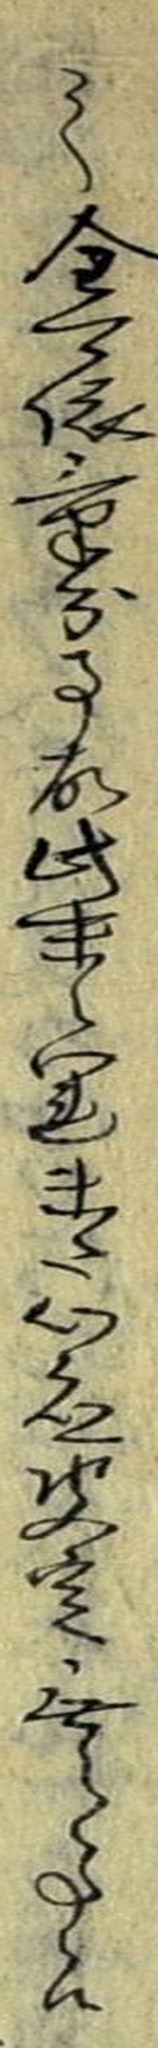之全可依気分事故此末之運未た心底決定無之事ニ候
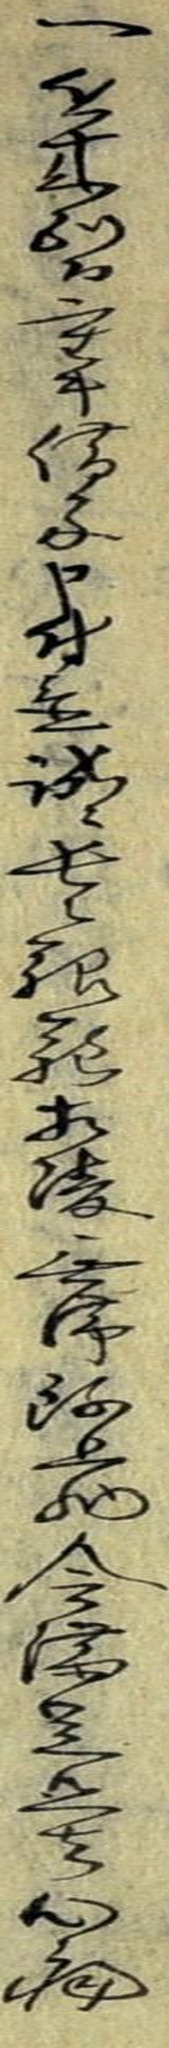一近来別而重キ借米申付置誠ニ長々艱難相凌無滞致上納令満足且者心痛
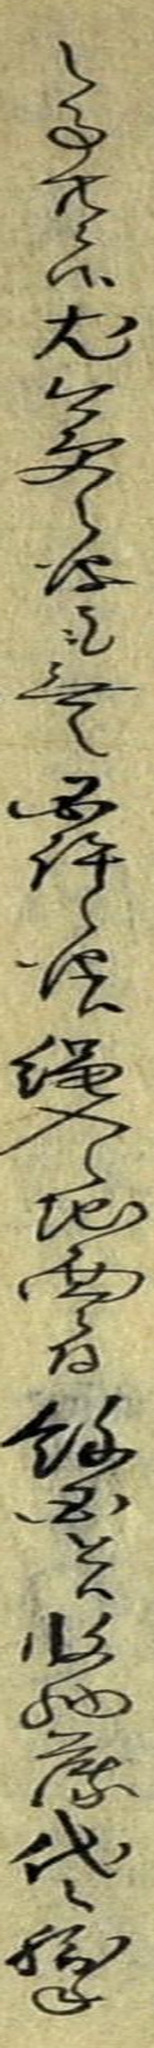之事共ニ候尤今更之儀ニも無之国許之儀ハ縄入之地面ニ付余国とハ収納薄
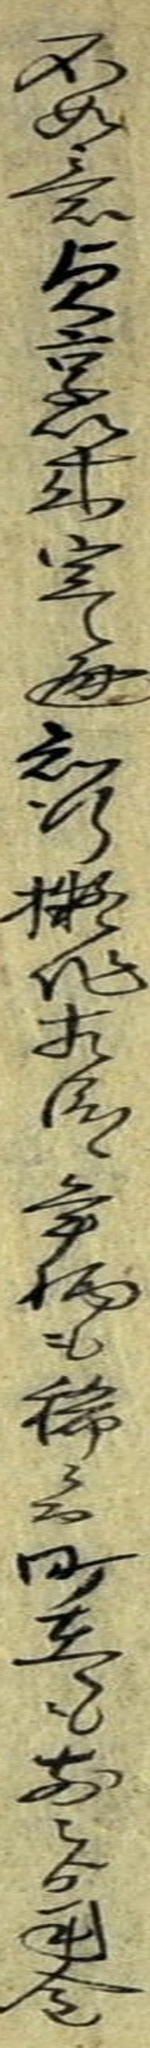不如意貞享以来定之通知行擬作相渡候年柄も稀ニ而町在へも前々ゟ用金
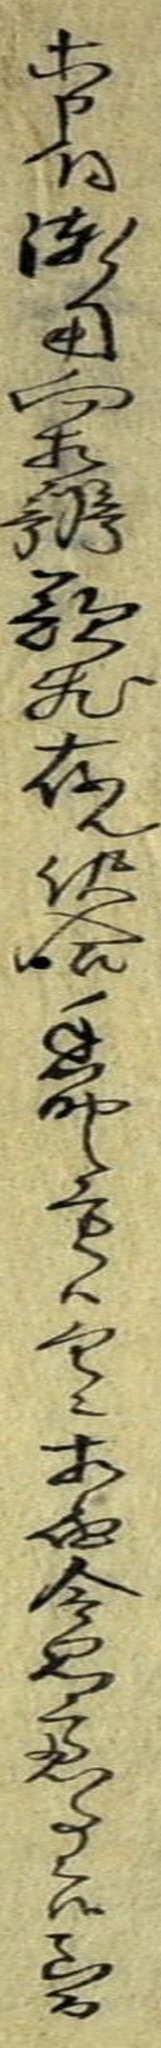等申付漸用向相弁歎敷存ル訳合手筋之方ヘハ具ニ相届令思慮事ニ候至而
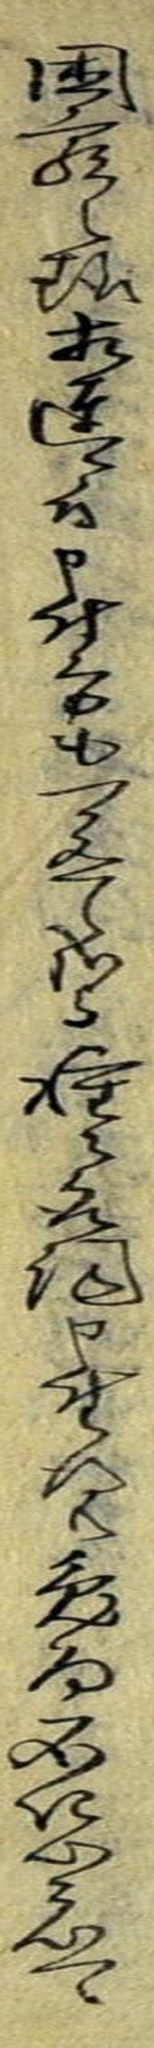困窮之趣相達候ニ付申付方も可有之哉与種々取調申付候得共兎角不任心底候

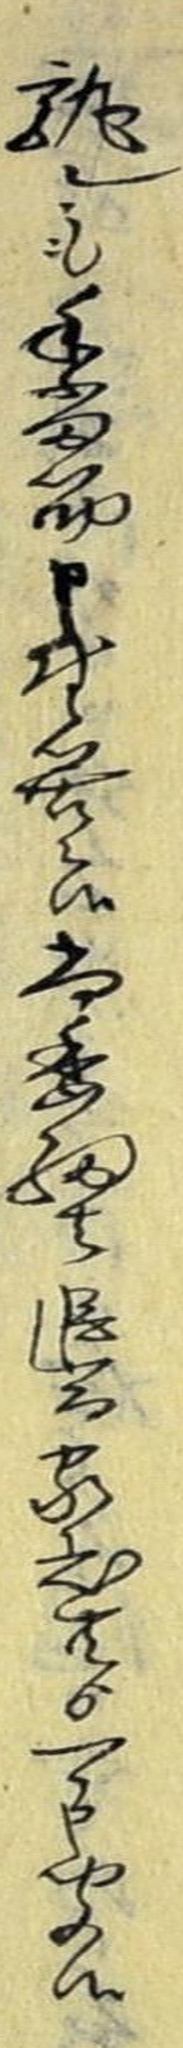孰レニも手当筋申付候筈ニ候尚委細者追而家老共ゟ可申聞候
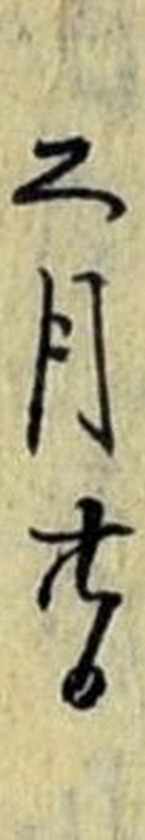二月廿日
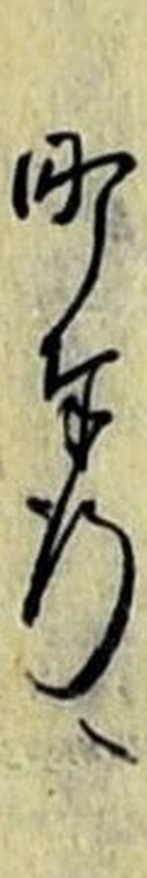町奉行へ
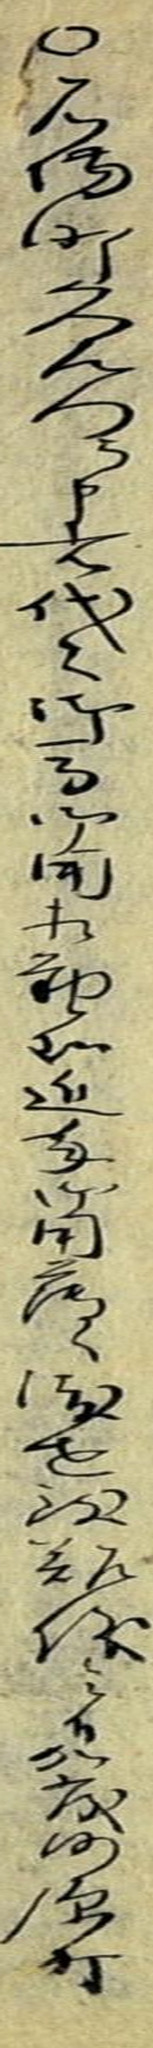〇石場町久左衛門与申者代々御馬御用相勤候処近年御用薄く渡世致難儀候ニ付加茂河原町
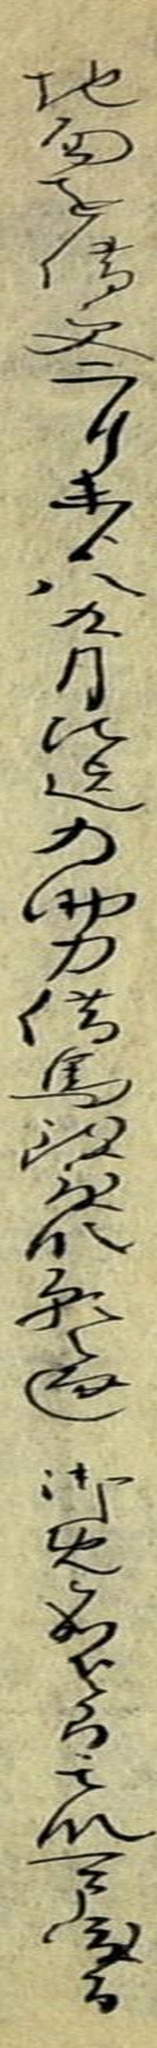地面を借受二月末ゟ八九月頃迄為助力借馬致度段願之通御免被成下候間其段可申渡旨
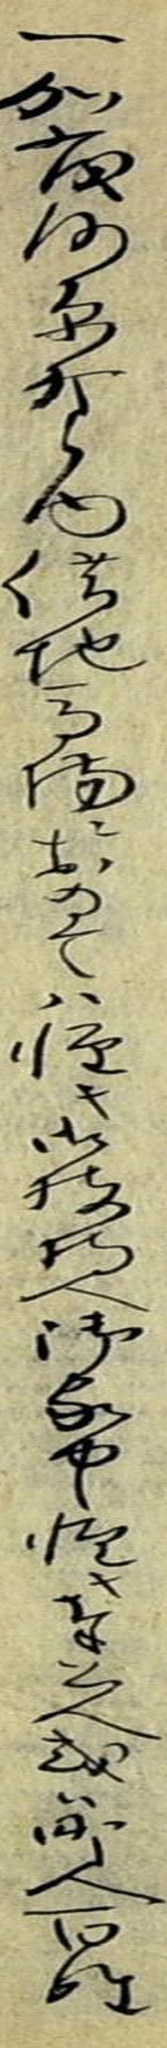一加茂河原町之内借地馬場ニおゐてハ軽キ御扶持人御家中軽キ奉公人或ハ町人百姓
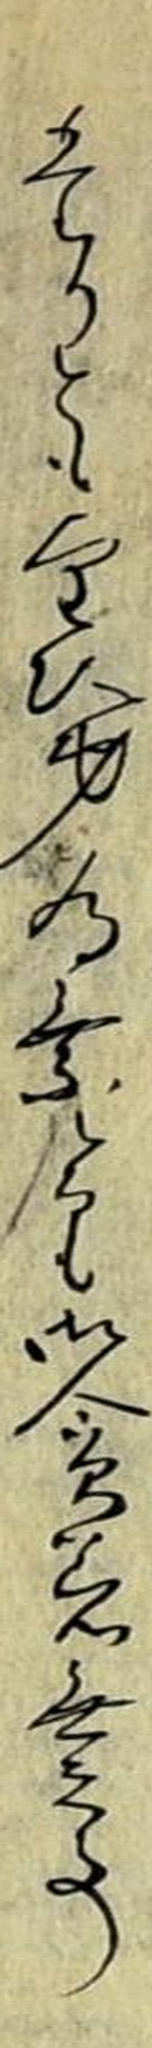たりとも望次第為乗候而も御貪着無之事
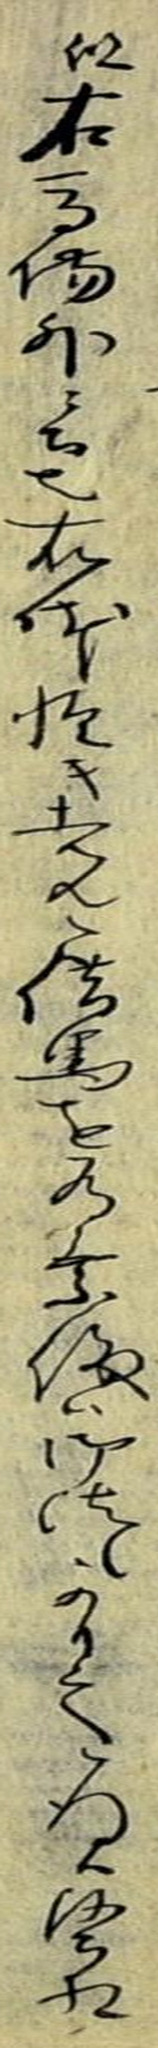但右馬場外ニ而者右体軽キ者共へ借馬を為乗儀ハ御法も有之候得ハ堅相
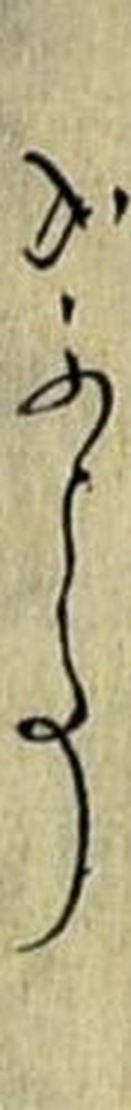成不候事
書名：命令之部 三
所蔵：福井県文書館 Fukui Prefectural Archives
